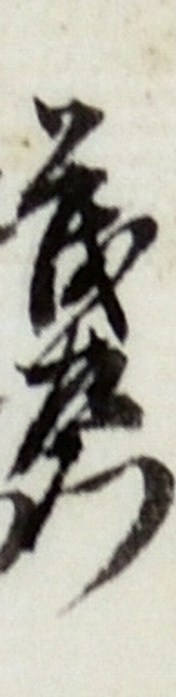喜左衛門
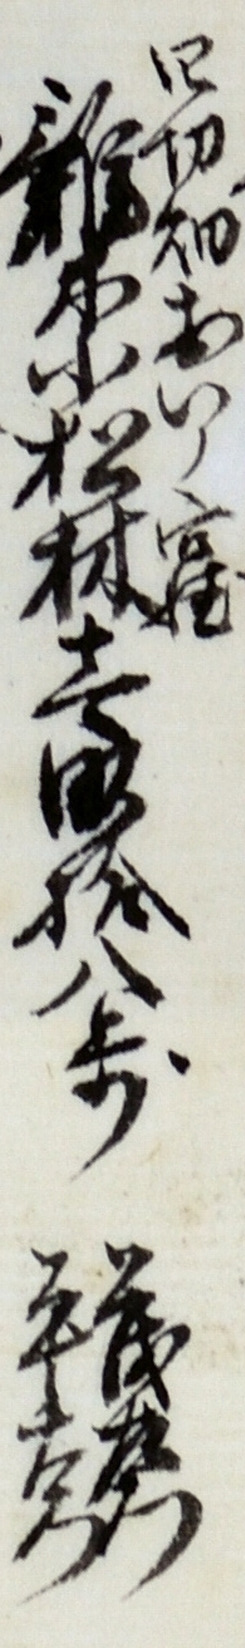雑木小松林壱畝拾八歩茂左衛門
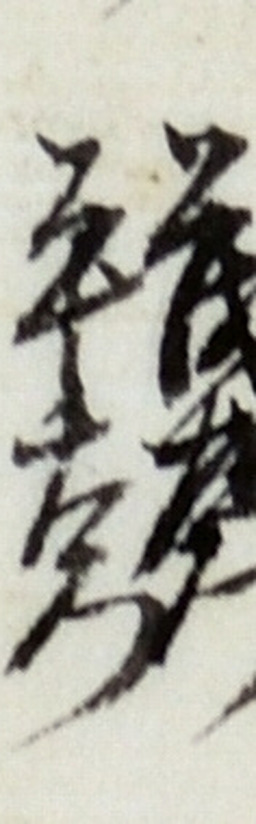平右衛門
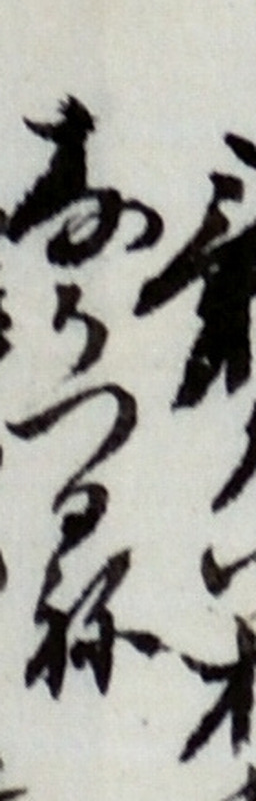すかつるね
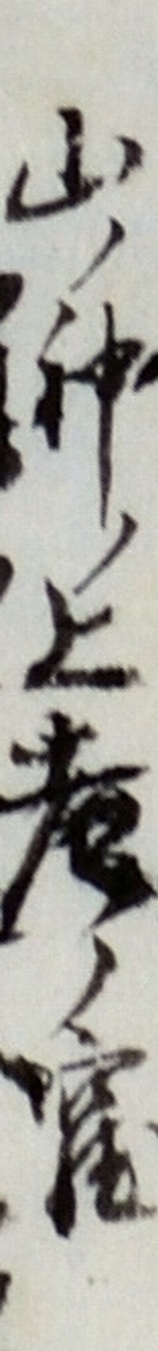山ノ神ノ上老ノ窪
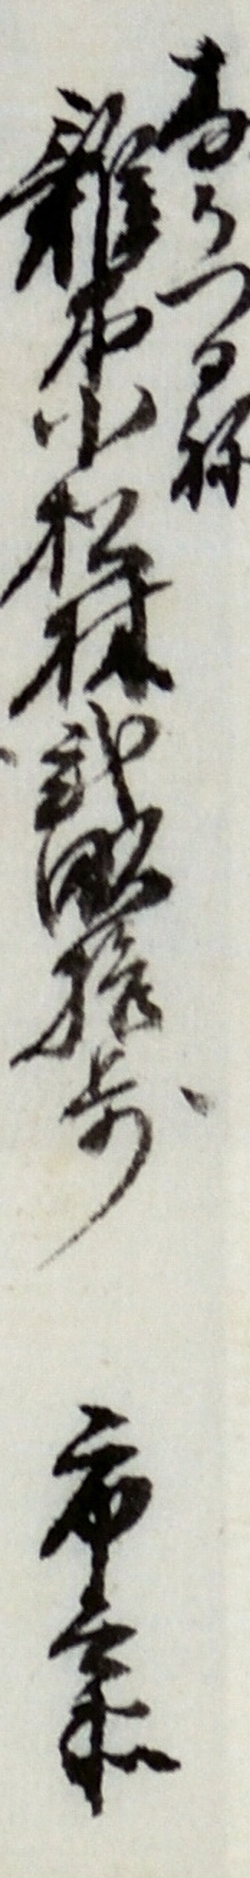雑木小松林弐畝拾歩市兵衛
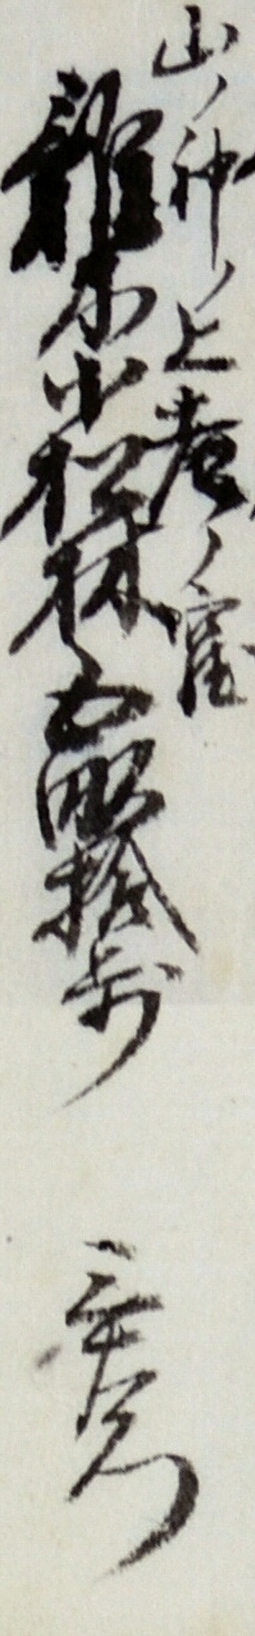雑木小松林五畝拾歩三右衛門
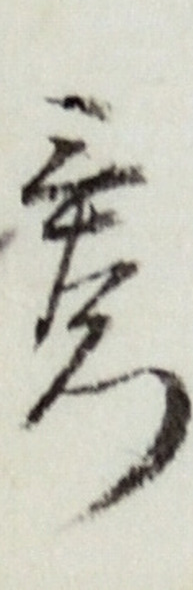喜左衛門
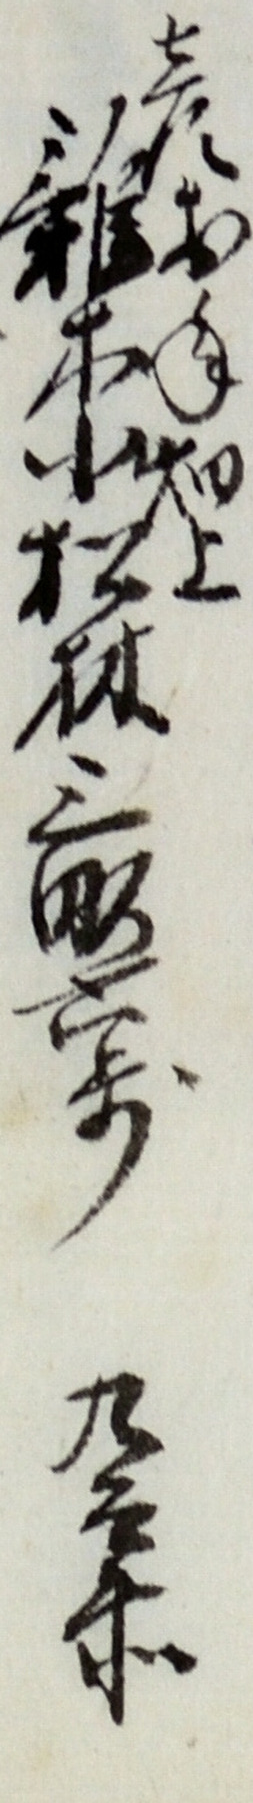雑木小松林三畝六歩九兵衛
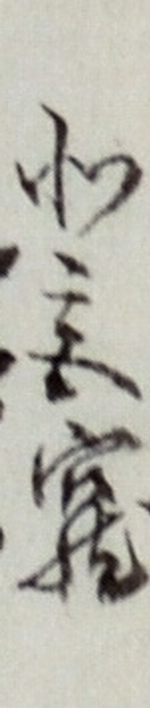北宮窪
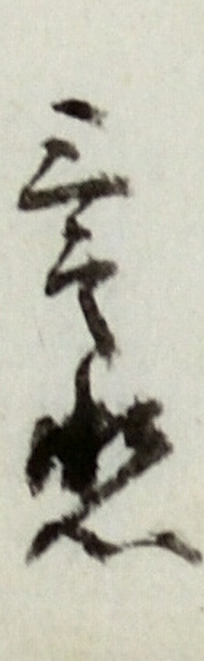市之丞
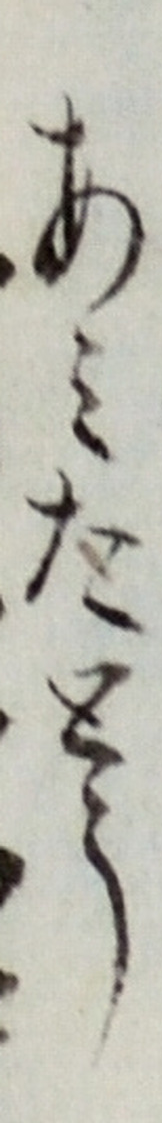あみたとう
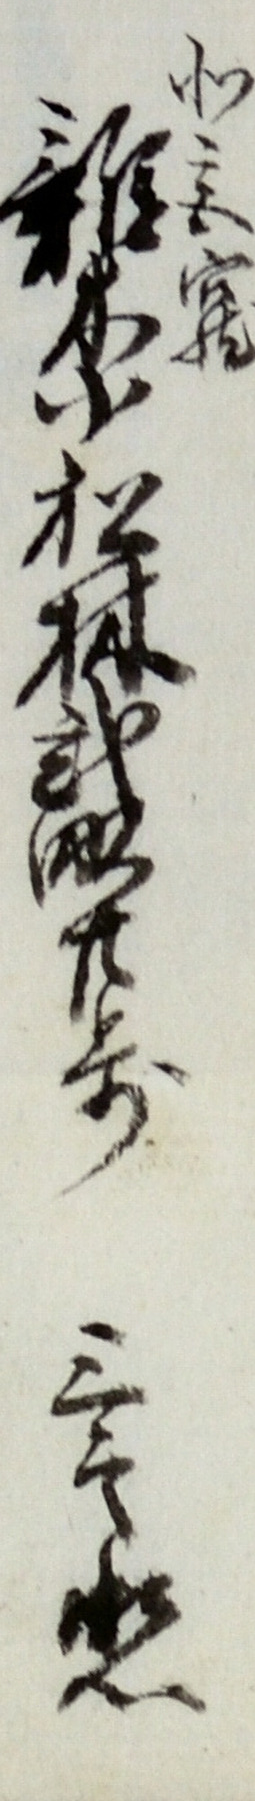雑木小松林弐畝廿歩三之丞
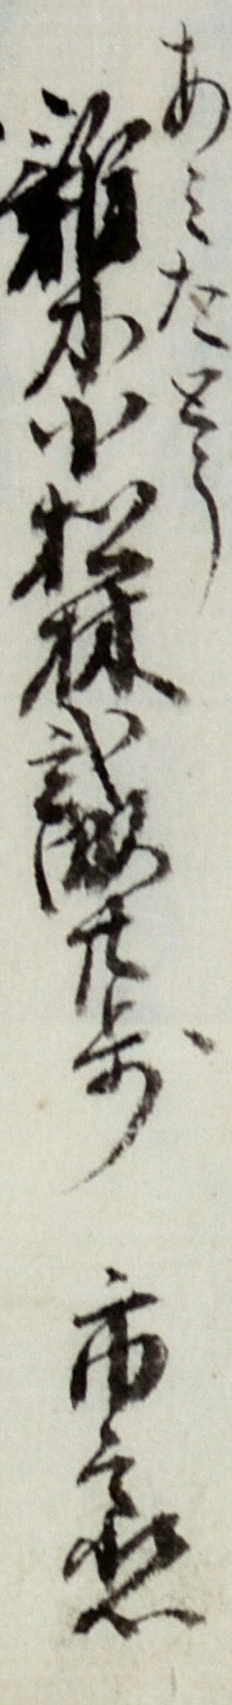雑木小松林弐畝廿歩三之丞
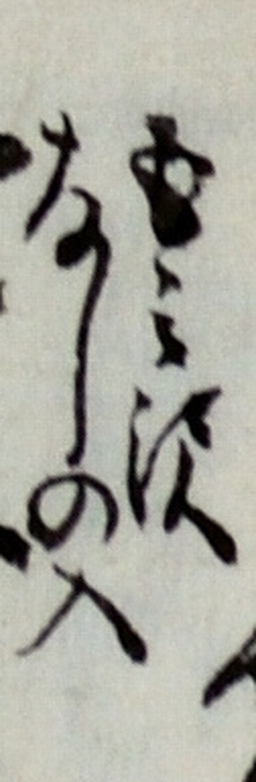なしの入
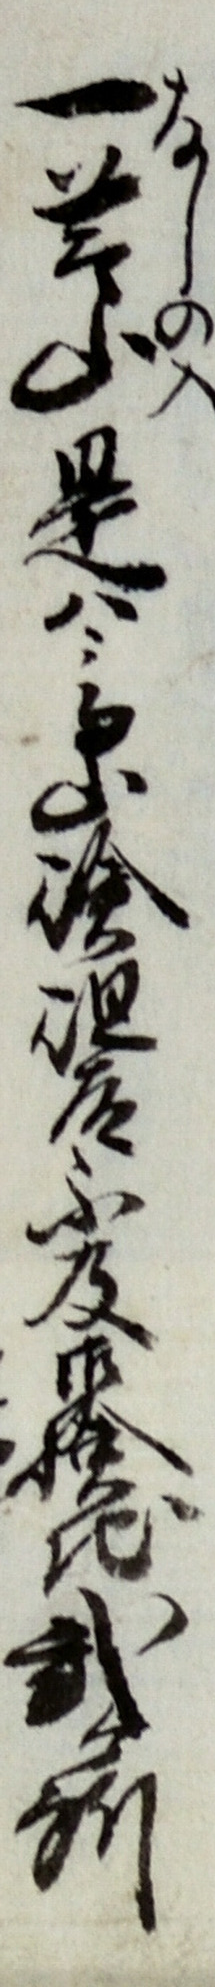一芝山是ハ高山嶮阻故不及御検地弐ヶ所
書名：御領分中山林社地手控
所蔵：伊那市立高遠町図書館・合同会社AMANE
